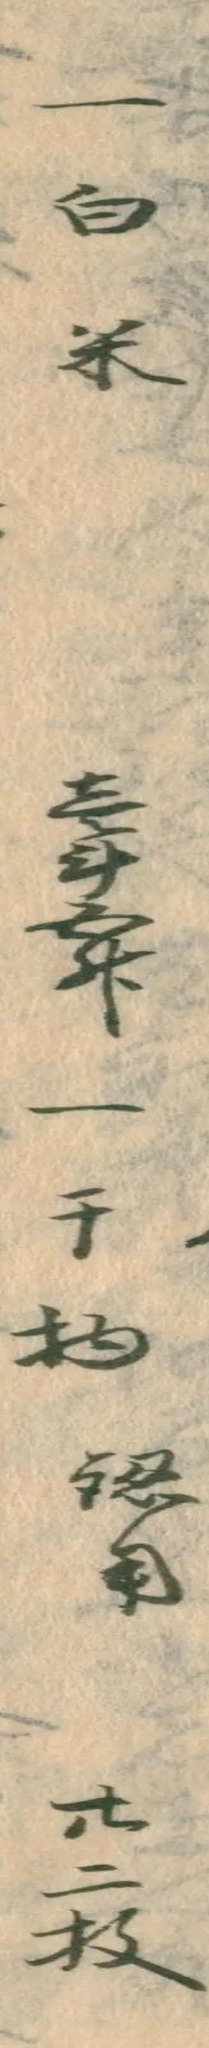一白米壱斗五升一干物認用廿二枚
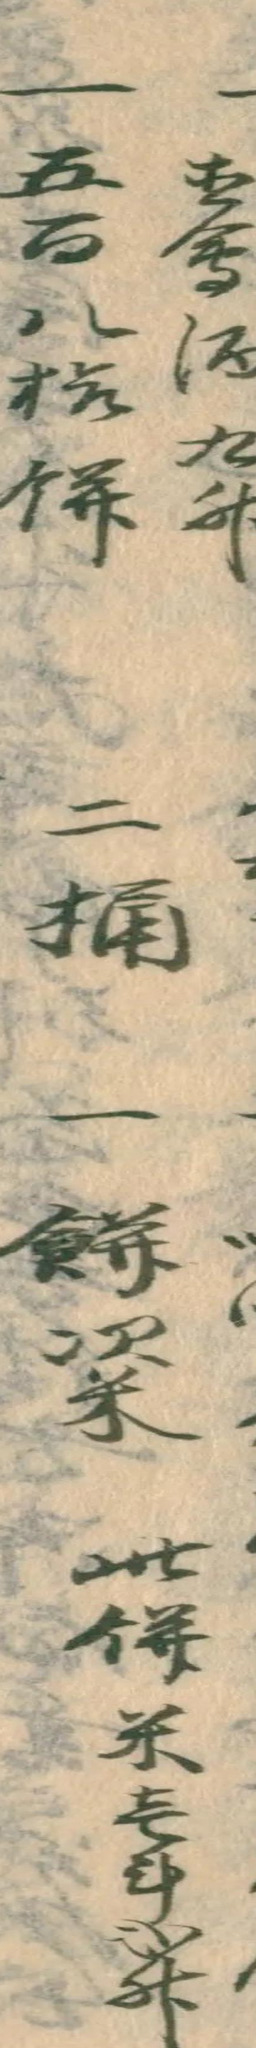一五百八拾餅二桶一餅粢此餅米壱斗弐升
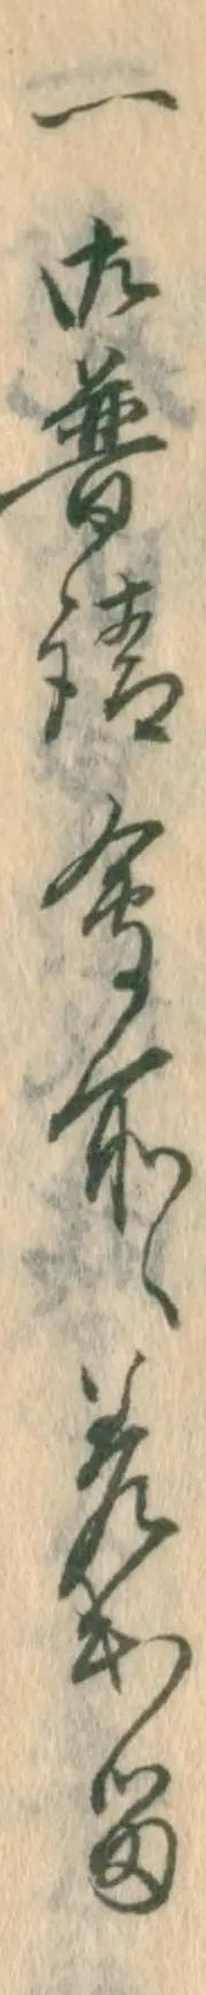一御普請会所へ差出留
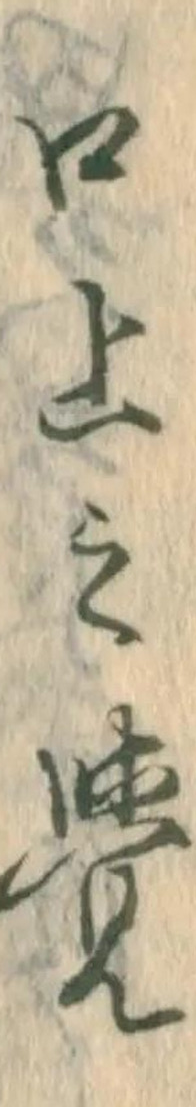口上之覚
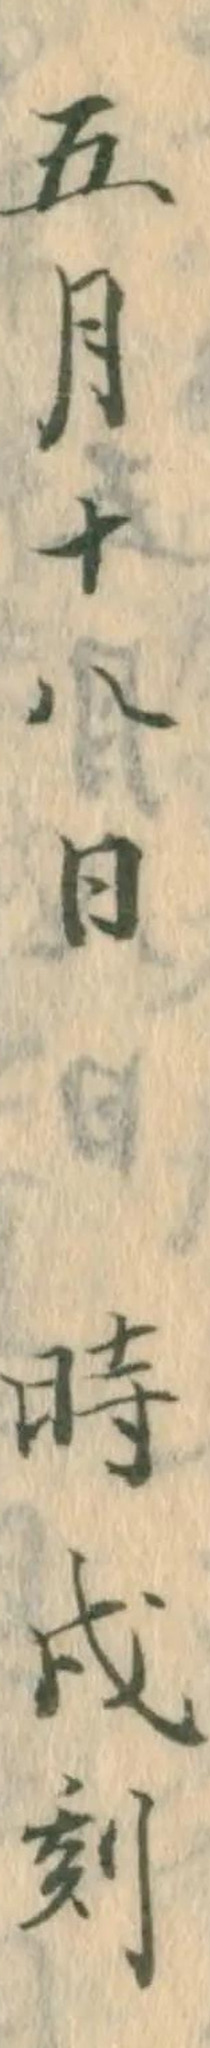五月十八日時戌刻
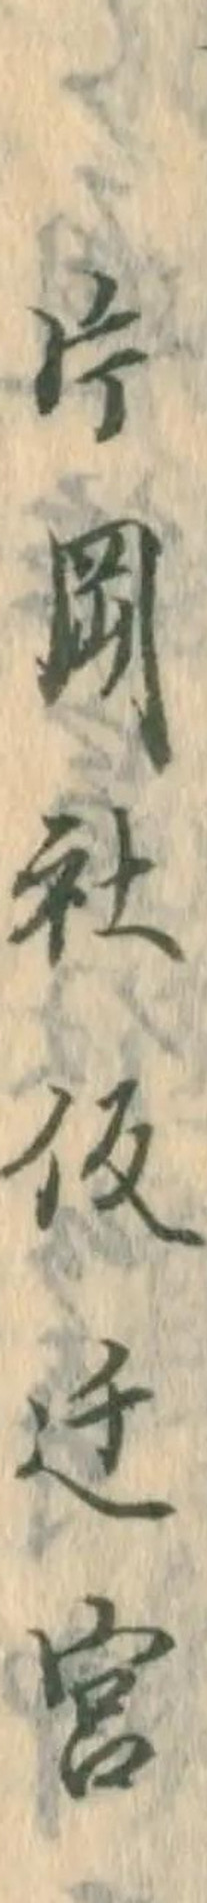片岡社仮迁宮
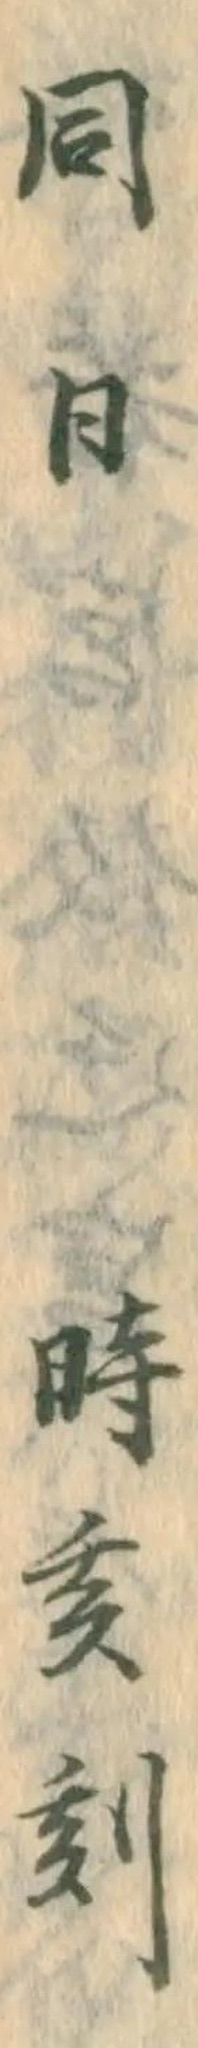同日時亥刻

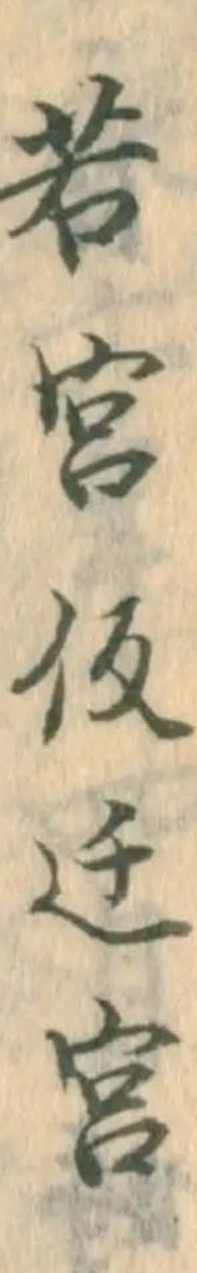若宮仮迁宮
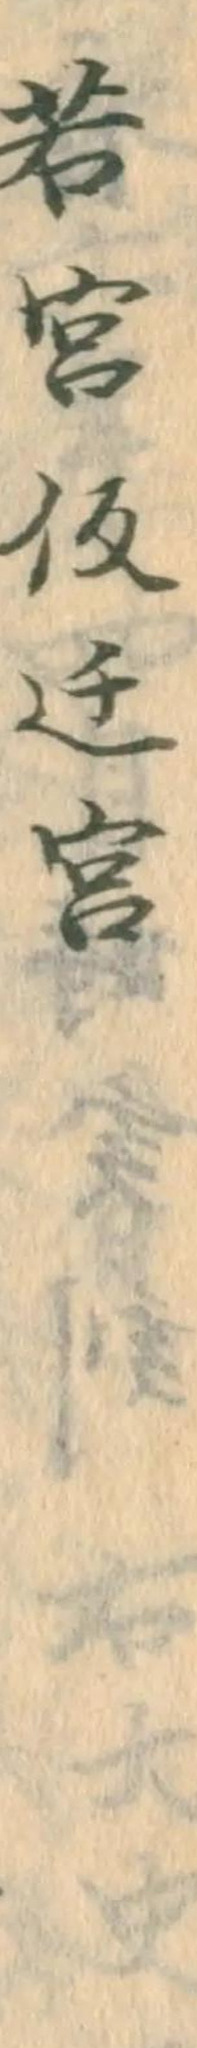若宮仮迁宮
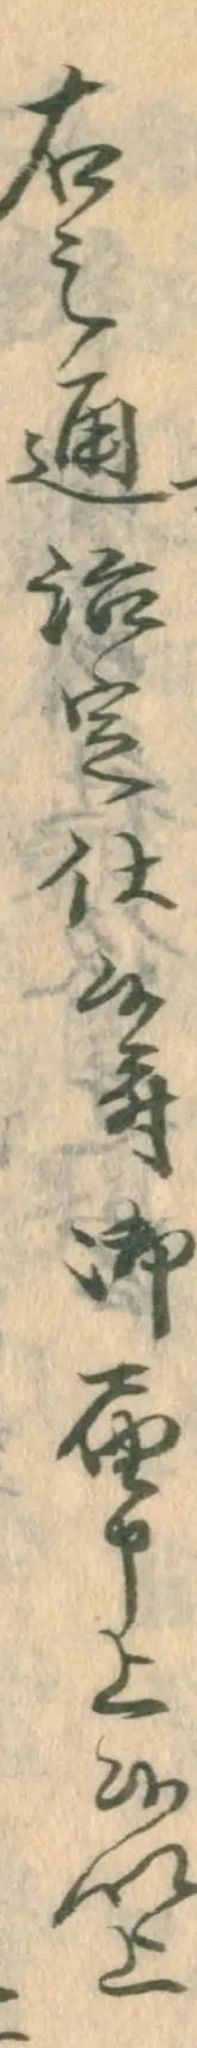右之通治定仕候ニ付御届申上候以上
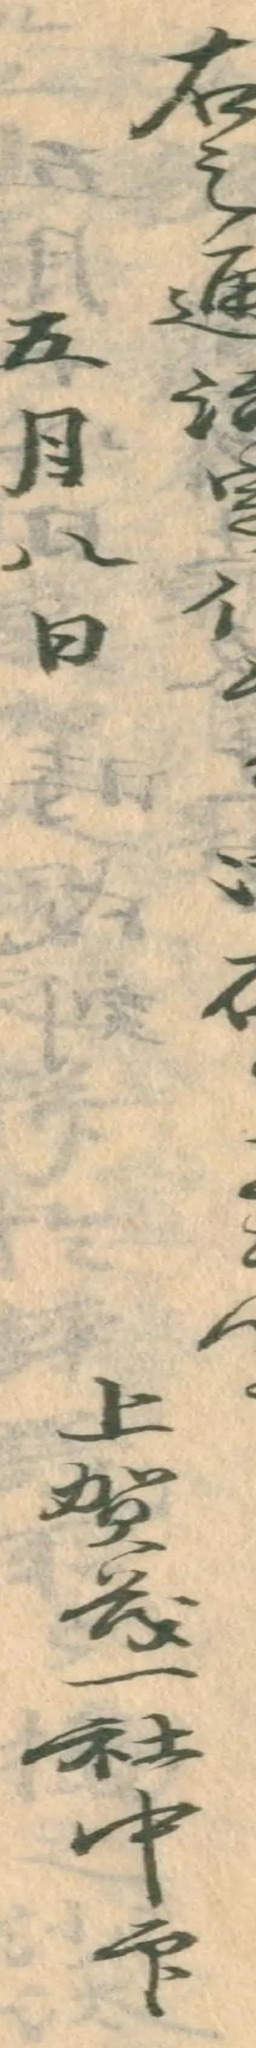五月八日上賀茂一社中印
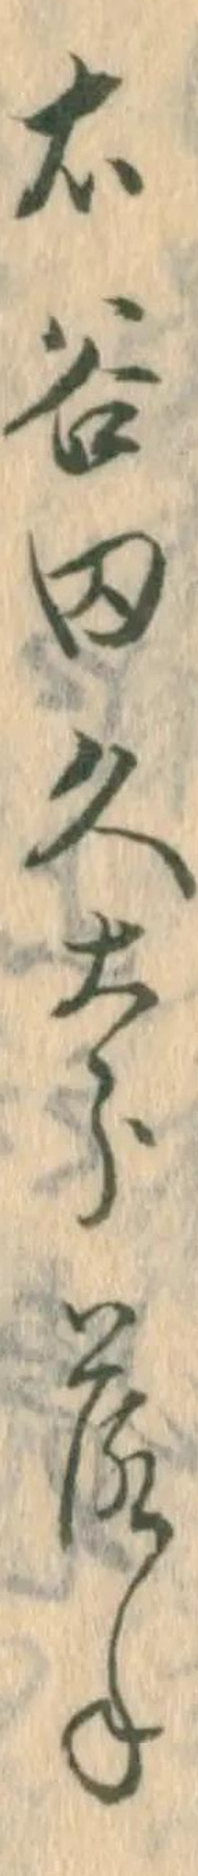右谷田久太郎落手
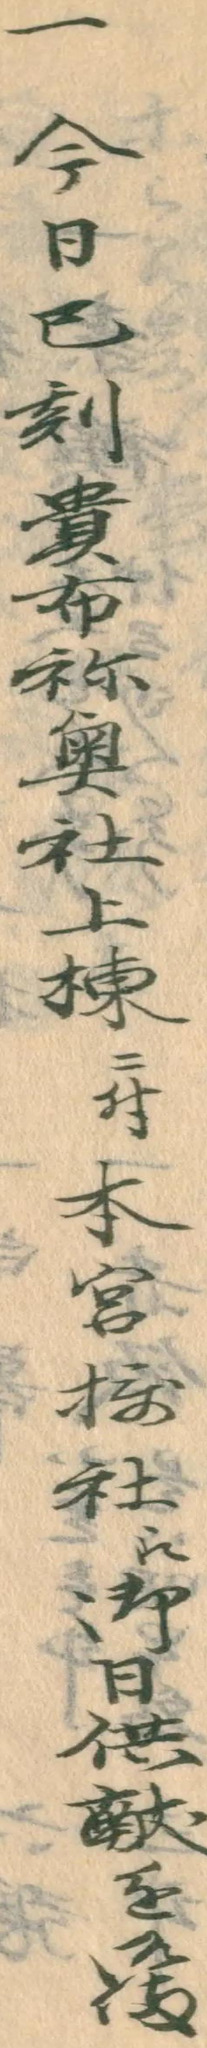一今日巳刻貴布祢奥社上棟ニ付本宮摂社江御日供献進御備
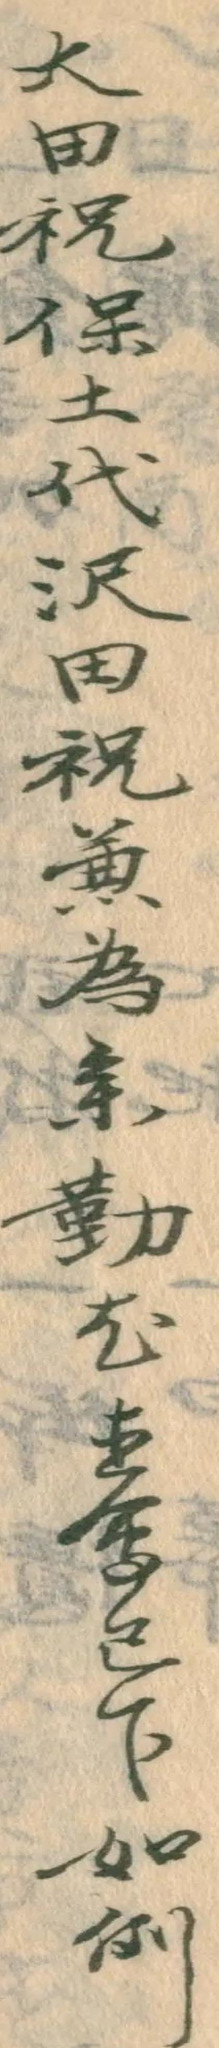大田祝保土代沢田祝兼為参勤尤直会已下如例
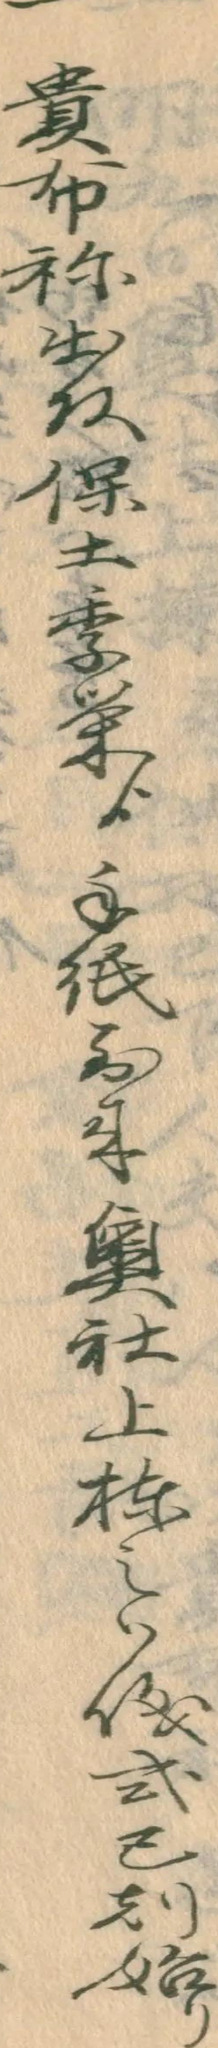一貴布祢出頭保土季栄ゟ手紙到来奥社上棟之御儀式巳刻始り
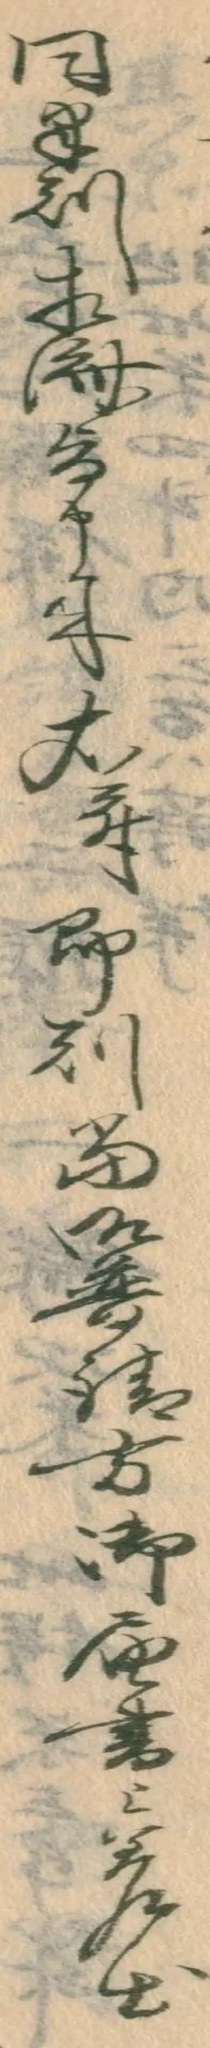同半刻相済旨申来右ニ付即刻当御普請方御届書被差出
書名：賀茂社記録. 第17冊
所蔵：国立国会図書館 National Diet Library, JAPAN
